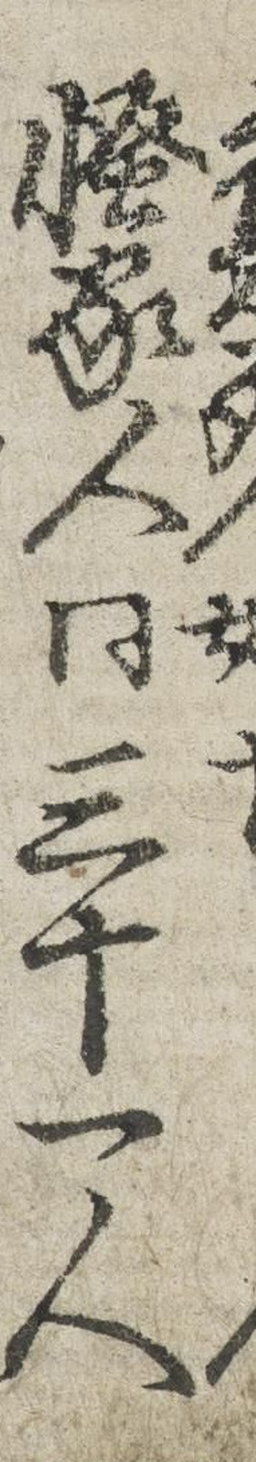いへ怪我人同十一人
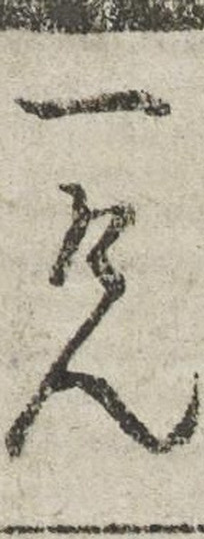一けん
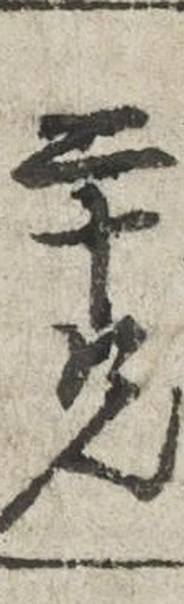二十けん

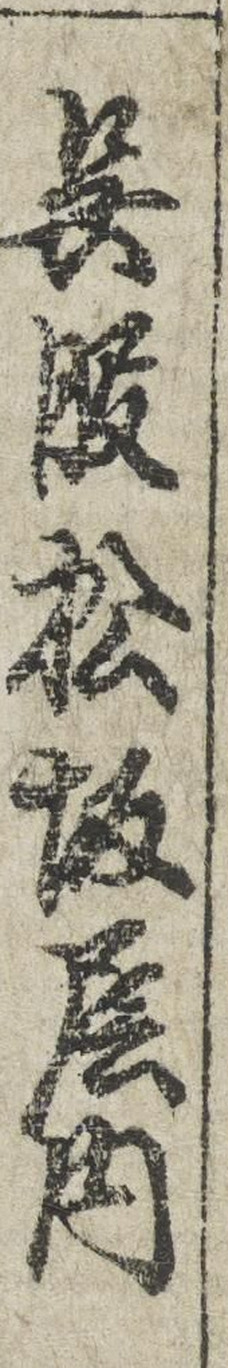下谷呉服松坂屋内
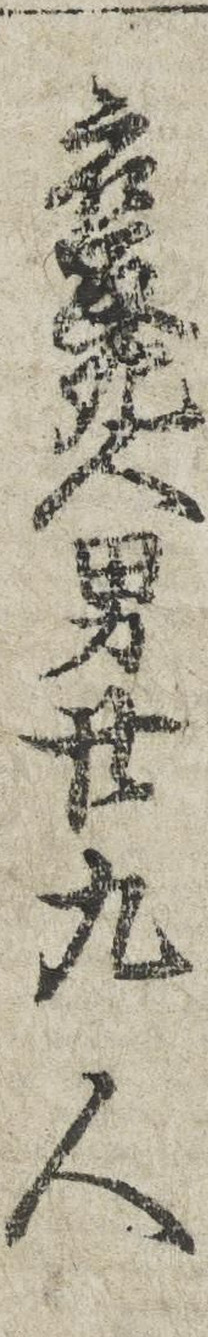廣変死人男廿九人
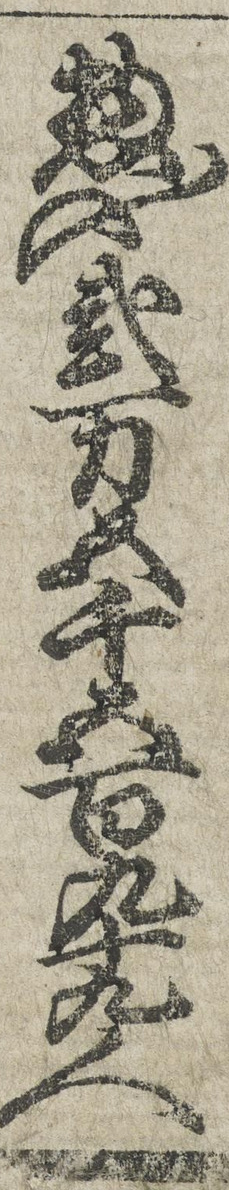惣〆弐万五千五百九十九人
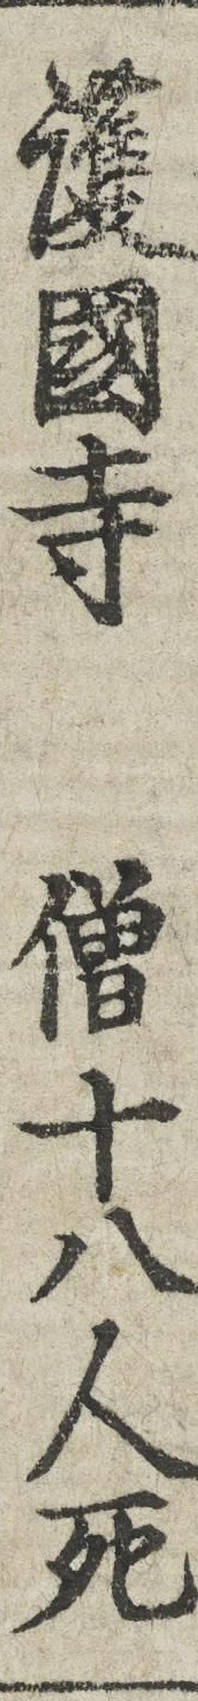護国寺僧十八人死
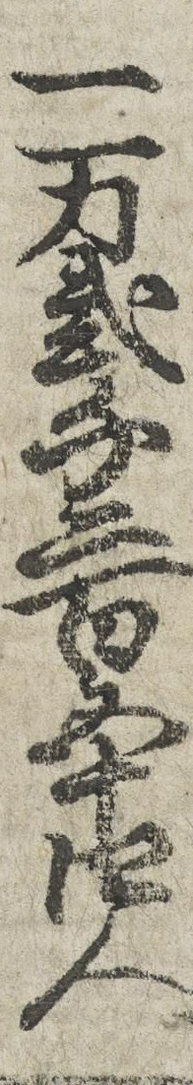一万弐千二百五十四人
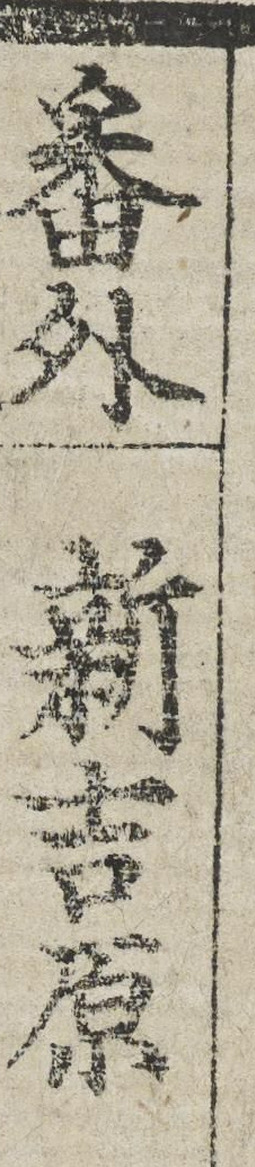番外新吉原
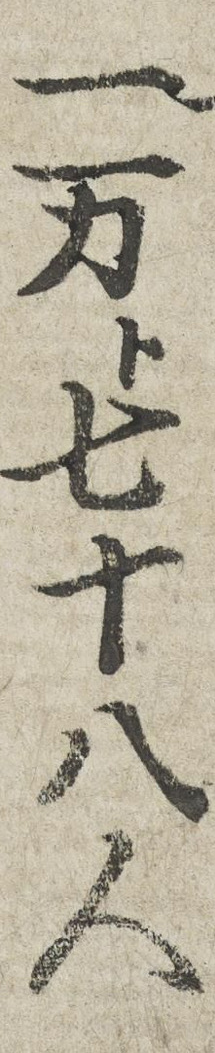一万ト七十八人
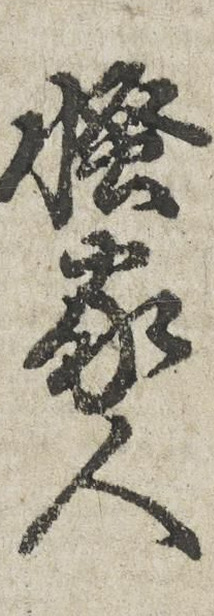怪我人
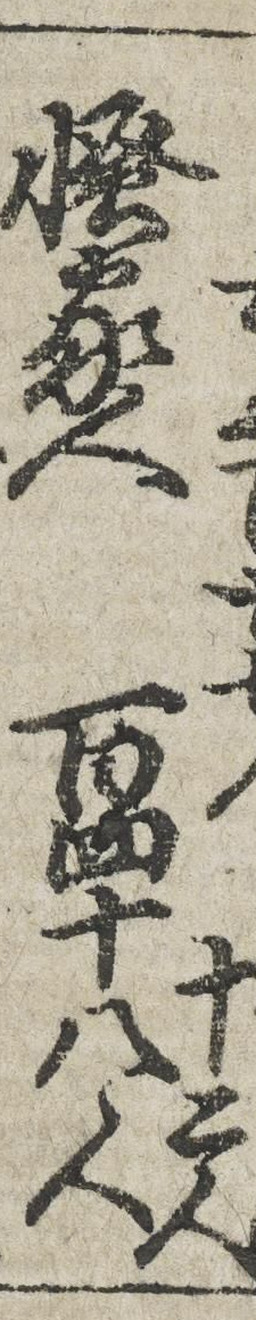出火怪我人百四十八人
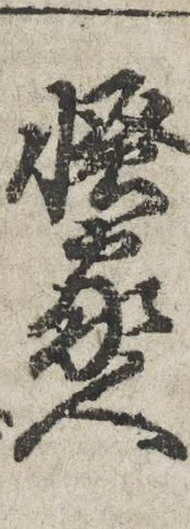怪我人
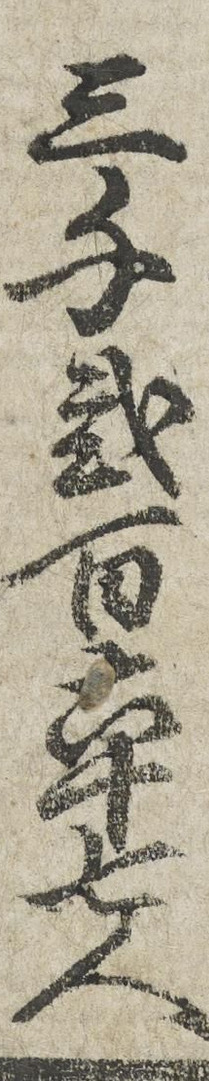三千弐百六十七人
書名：[明暦大火に関する冊子]
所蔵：東京大学地震研究所図書室 Earthquake Research Institute Library, The University of Tokyo, JAPAN
